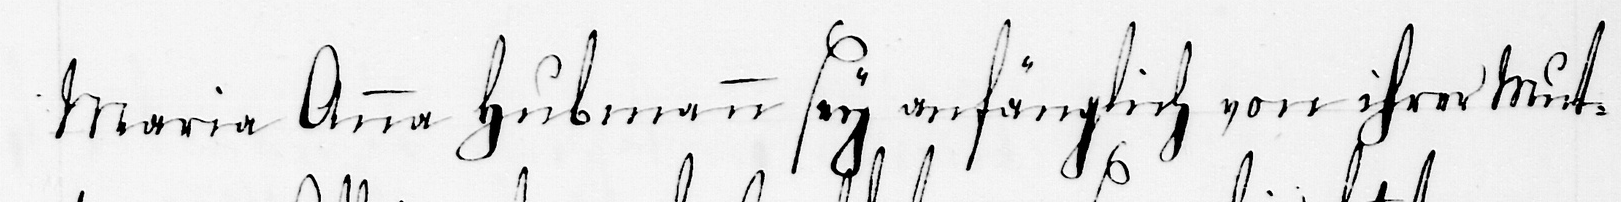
Maria Anna Hubmann sey anfänglich von ihrer Mut¬
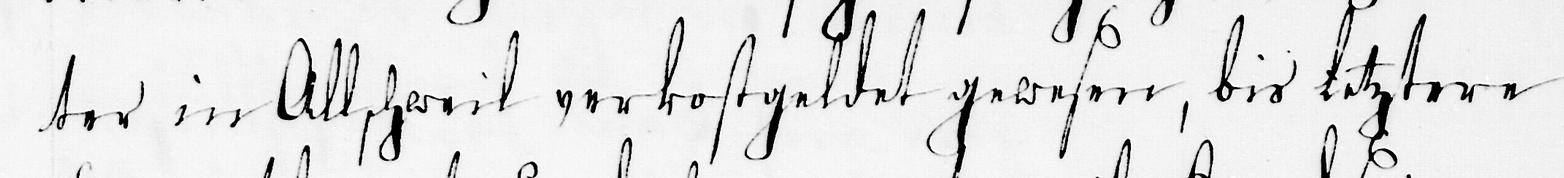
ter in Allschweil verkostgeldet gewesen, bis Letztere
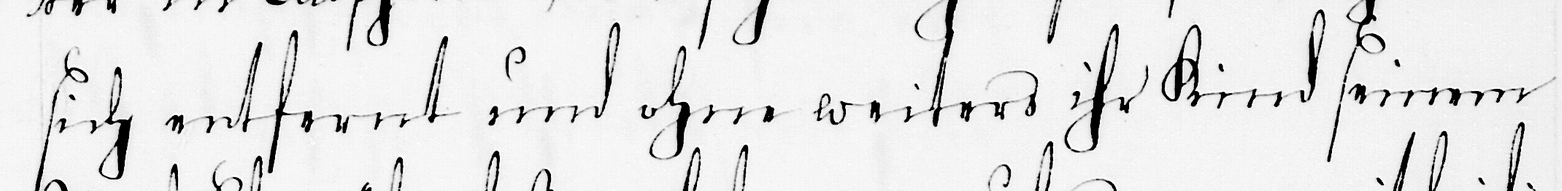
sich entfernt und ohne weiters ihr Kind seinem
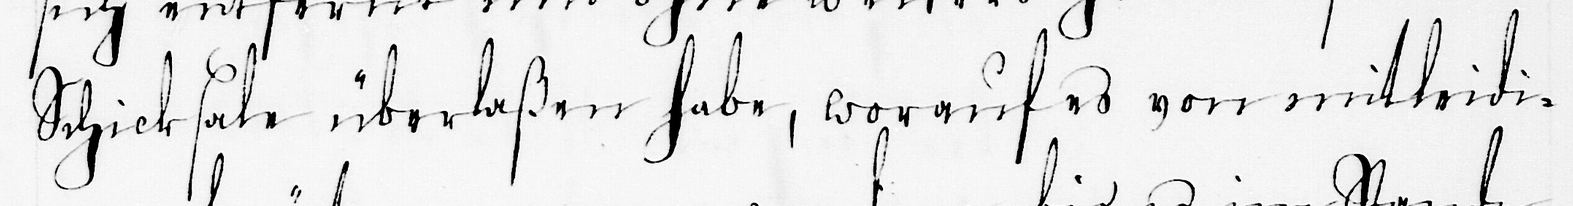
Schicksale überlaßen habe, worauf es von mitleidi¬
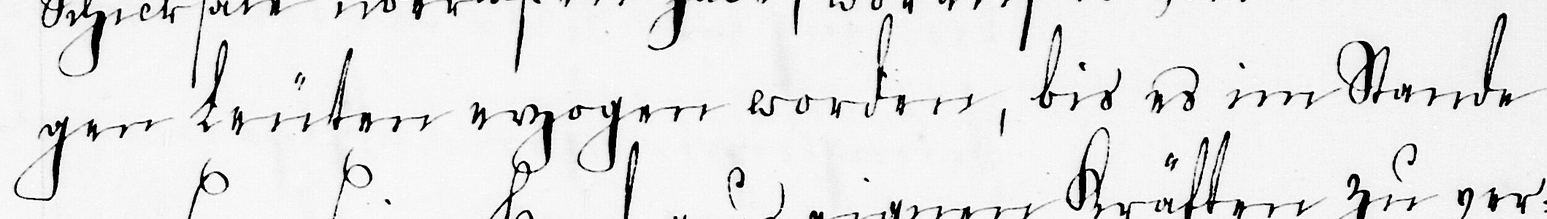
gen Leuten erzogen worden, bis es im Stande
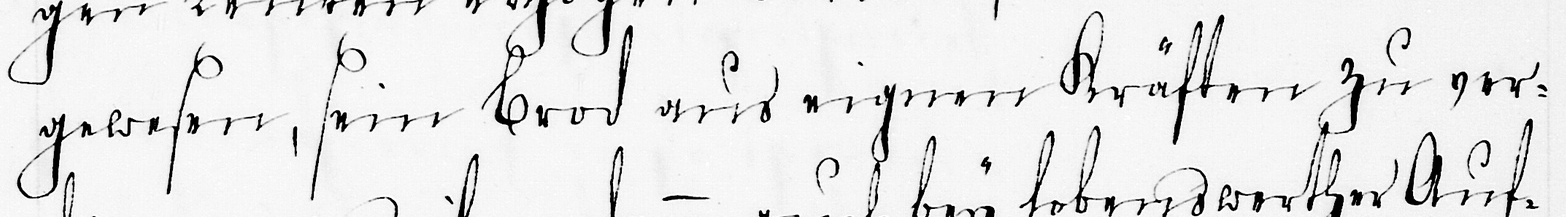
gewesen, sein Brod aus eignen Kräften zu ver¬
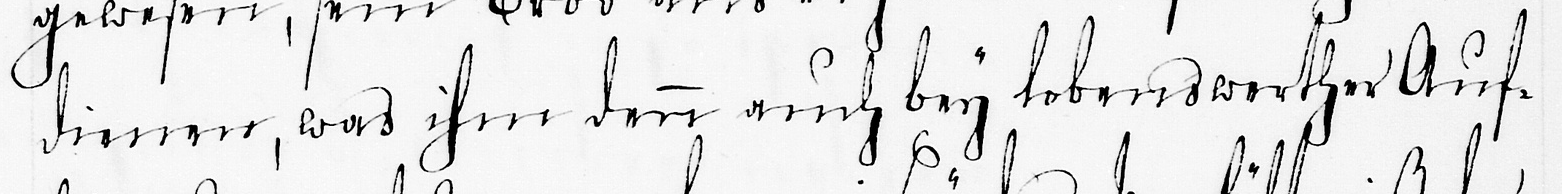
dienen, was ihm denn auch bey lobenswerther Auf¬
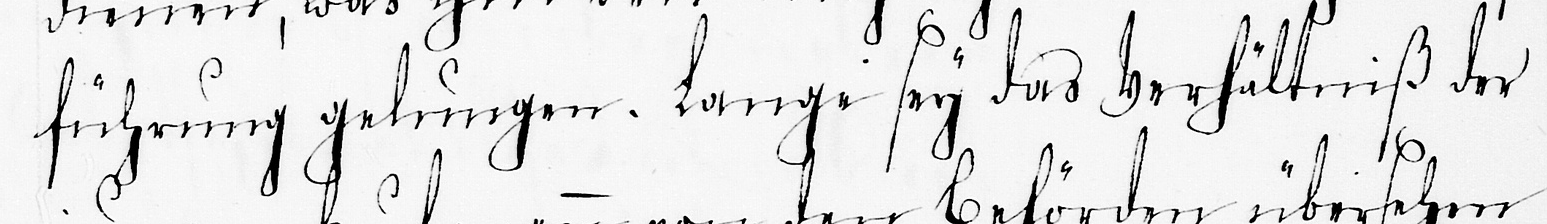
führung gelungen. Lange sey das Verhältniß der
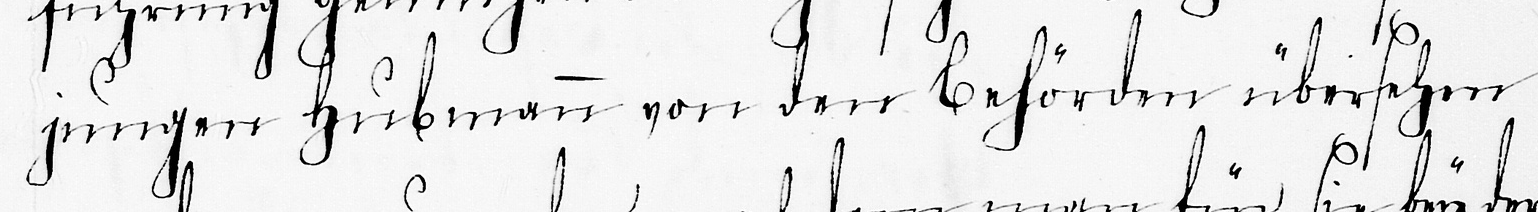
jungen Hubmann von den Behörden übersehen
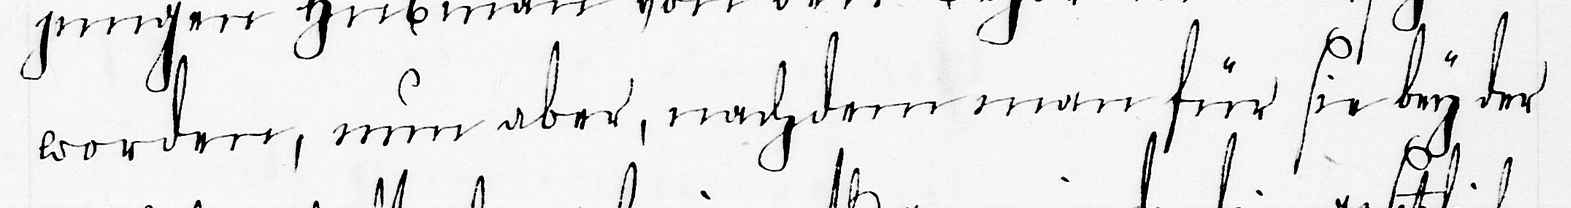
worden, nun aber, nachdem man für sie bey der
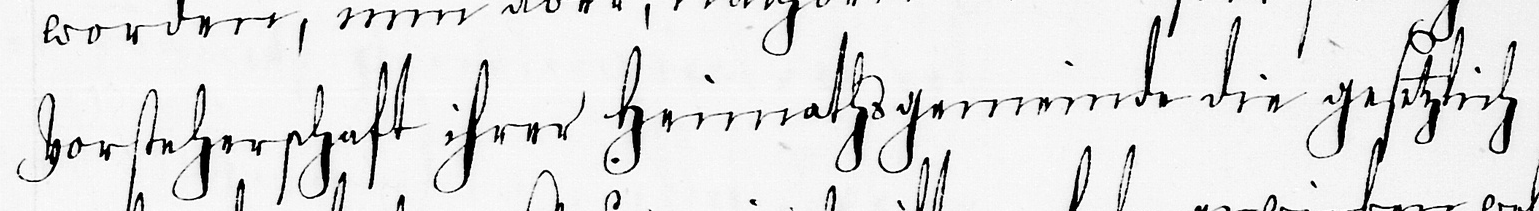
Vorsteherschaft ihrer Heimathsgemeinde die gesetzlich
